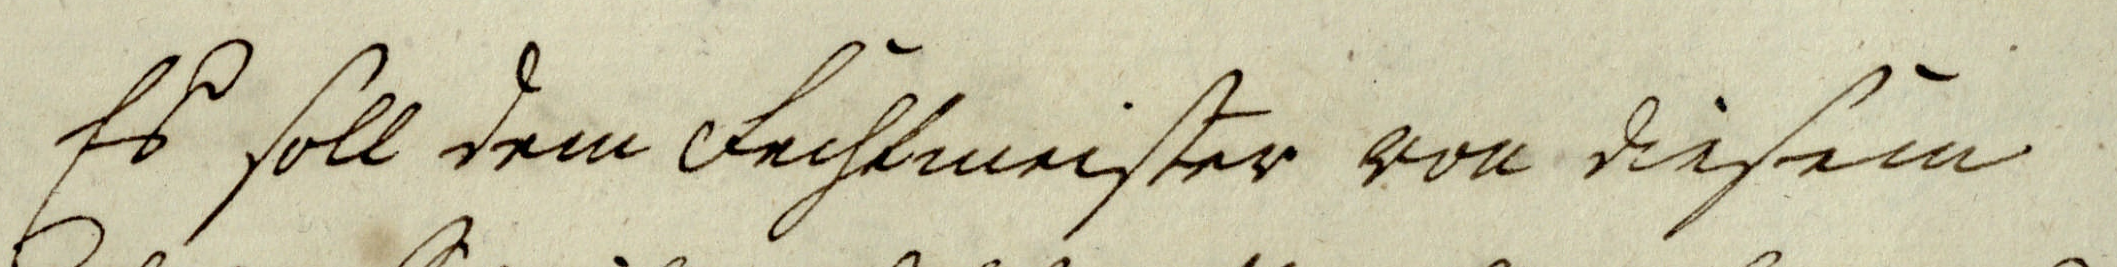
Es soll dem Fechtmeister von diesem
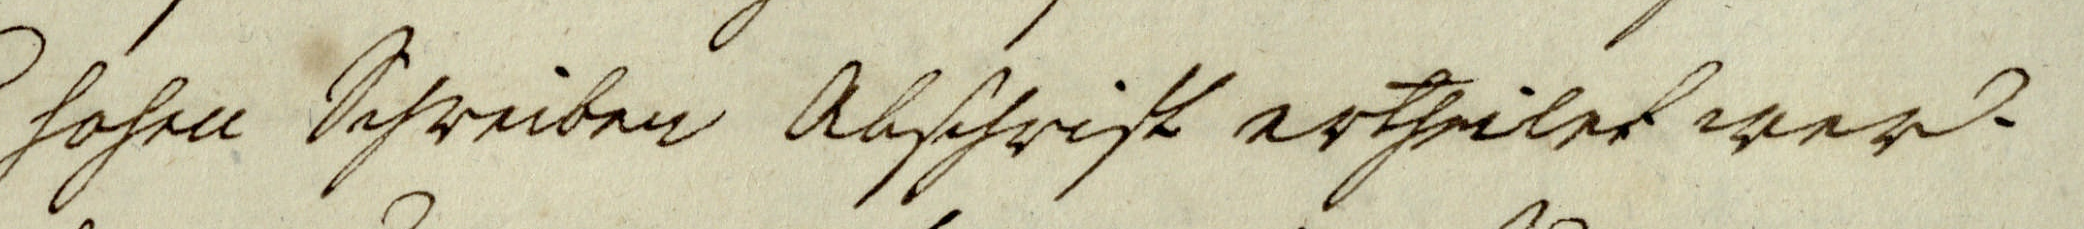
hohen Schreiben Abschrift ertheilet wer¬
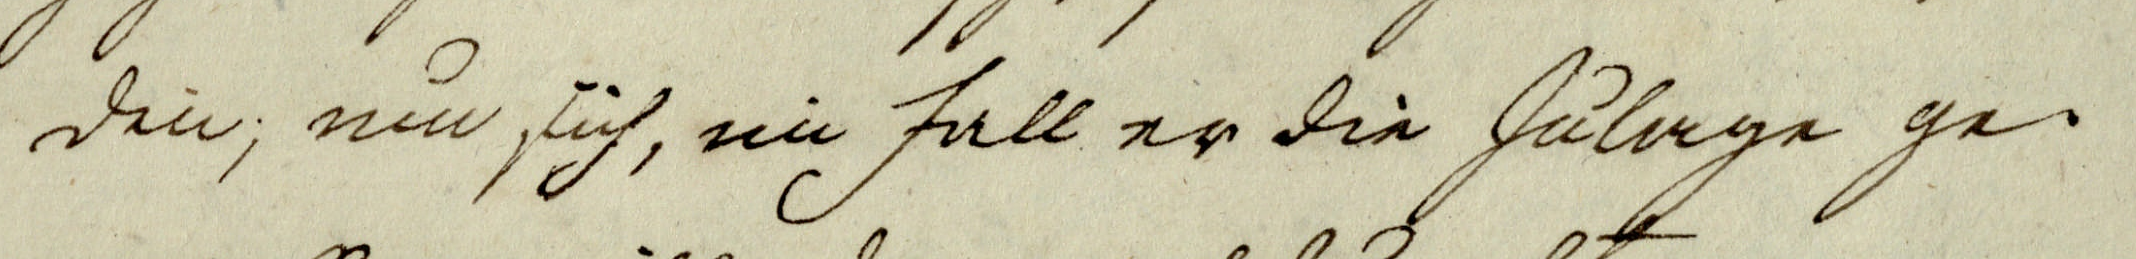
den; um sich, im Fall er die Zulage ge¬
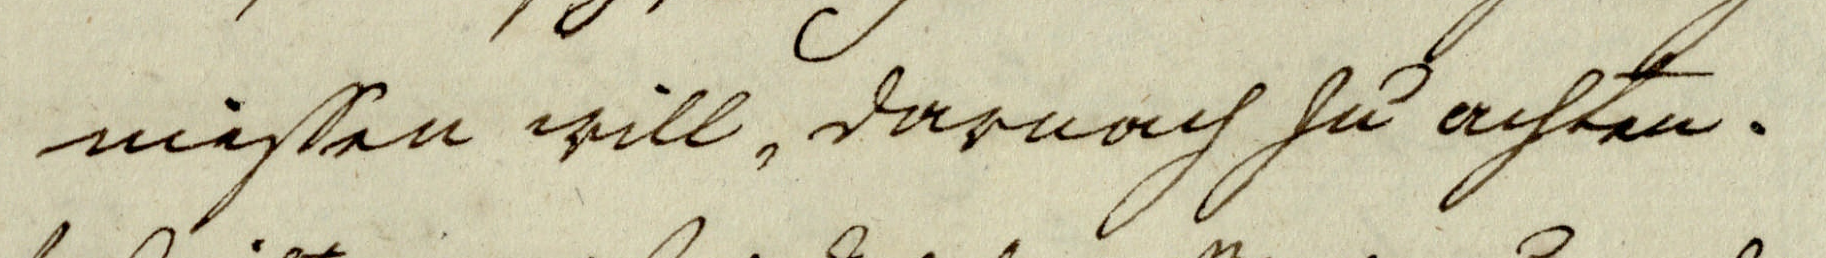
niessen will, darnach zu achten.
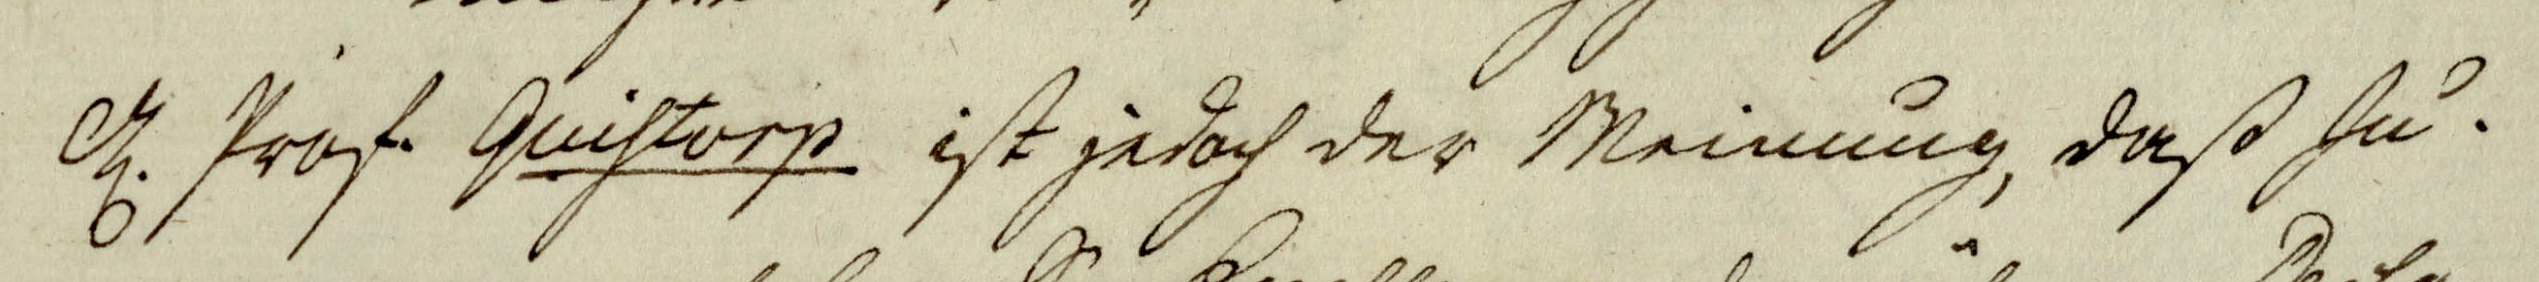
dh. Prof. Quistorp. ist jedoch der Meinung, daß zu¬
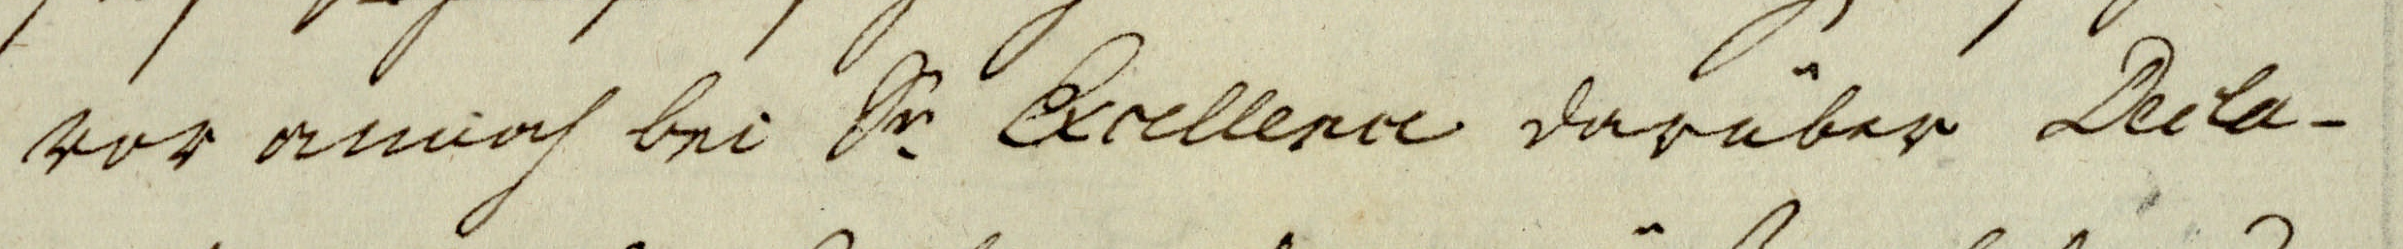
vor annoch bei Sr Excellence darüber Decla¬
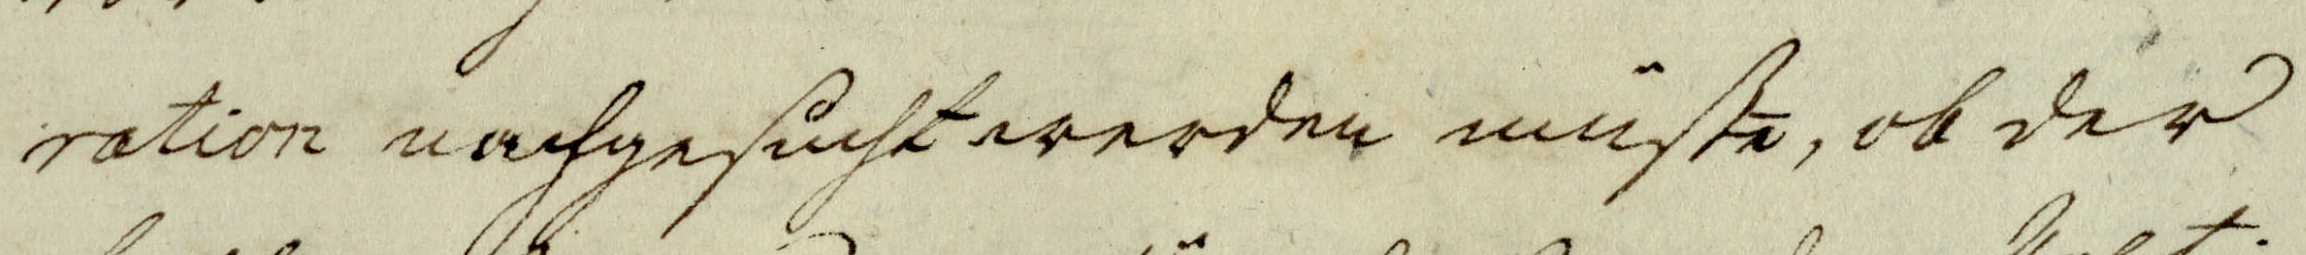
ration nachgesucht werden müßte, ob der
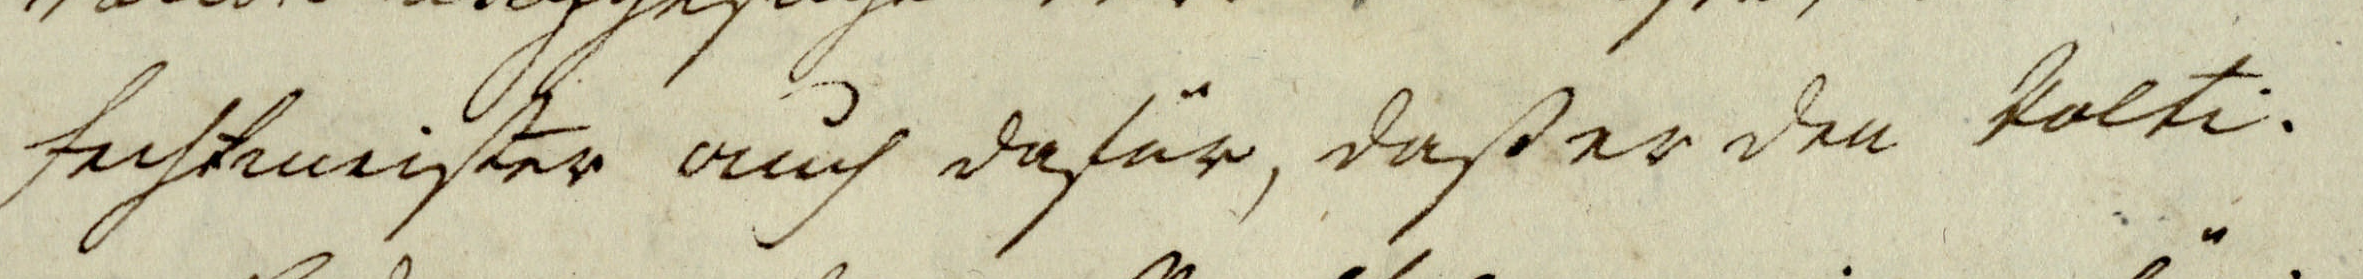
Fechtmeister auch dafür, daß er den Volti¬
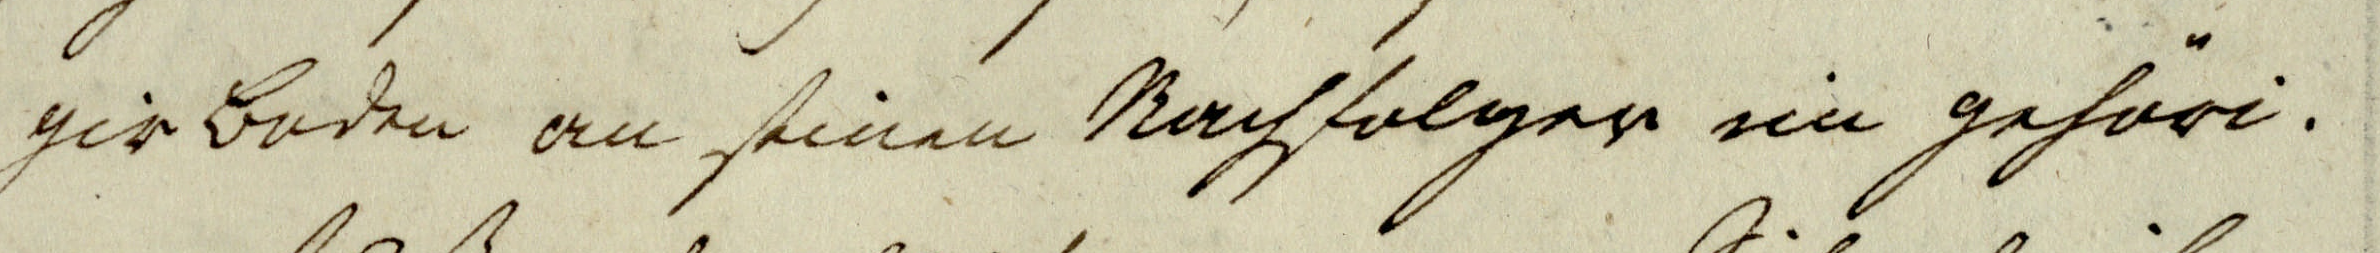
gir Boden an seinen Nachfolger im gehöri-
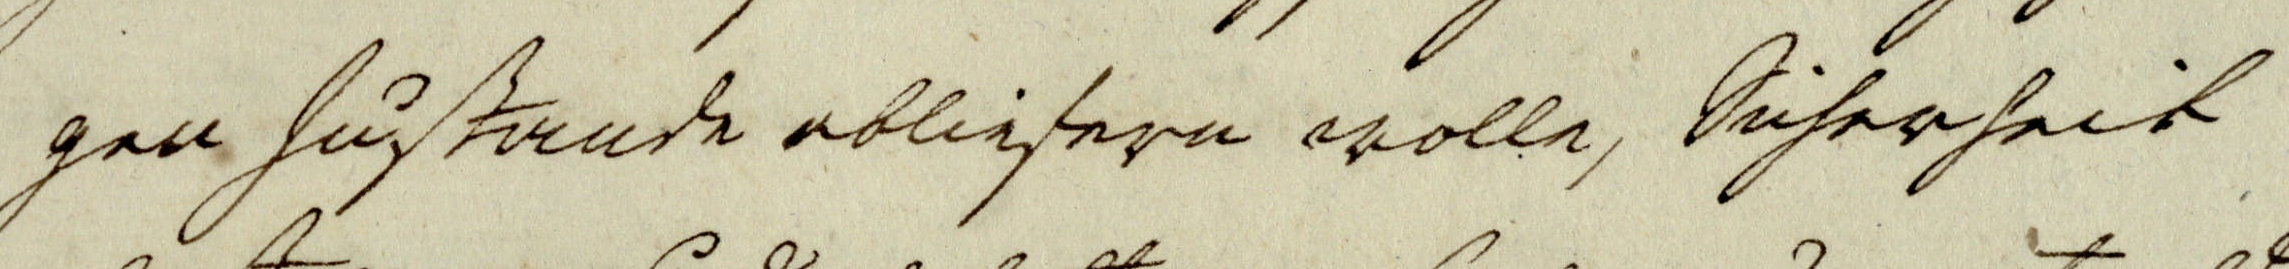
gen Zustande abliefern wolle, Sicherheit
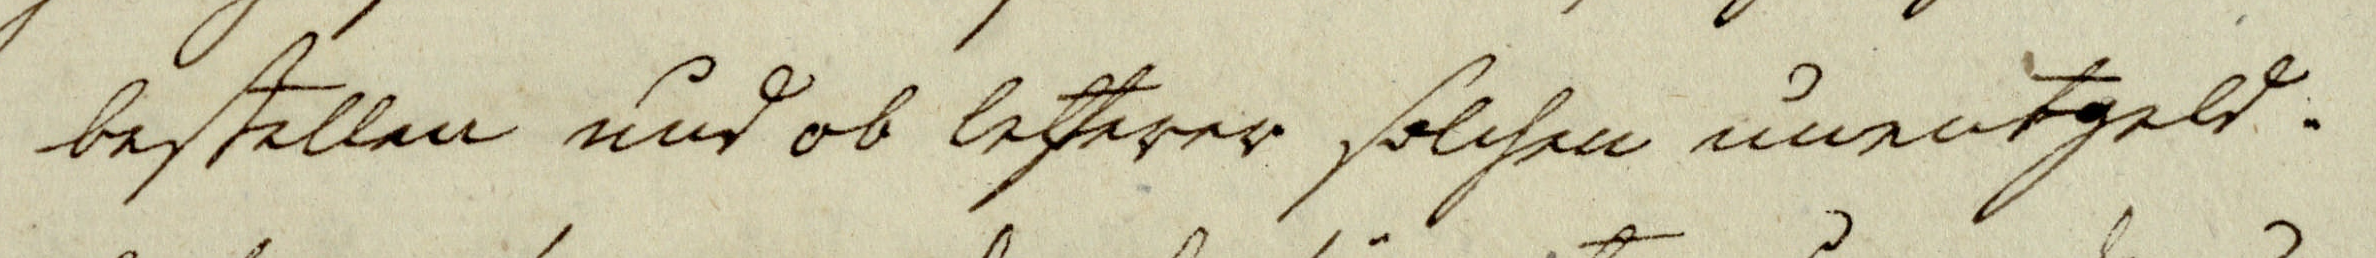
bestellen und ob letzterer solchen unentgeld¬
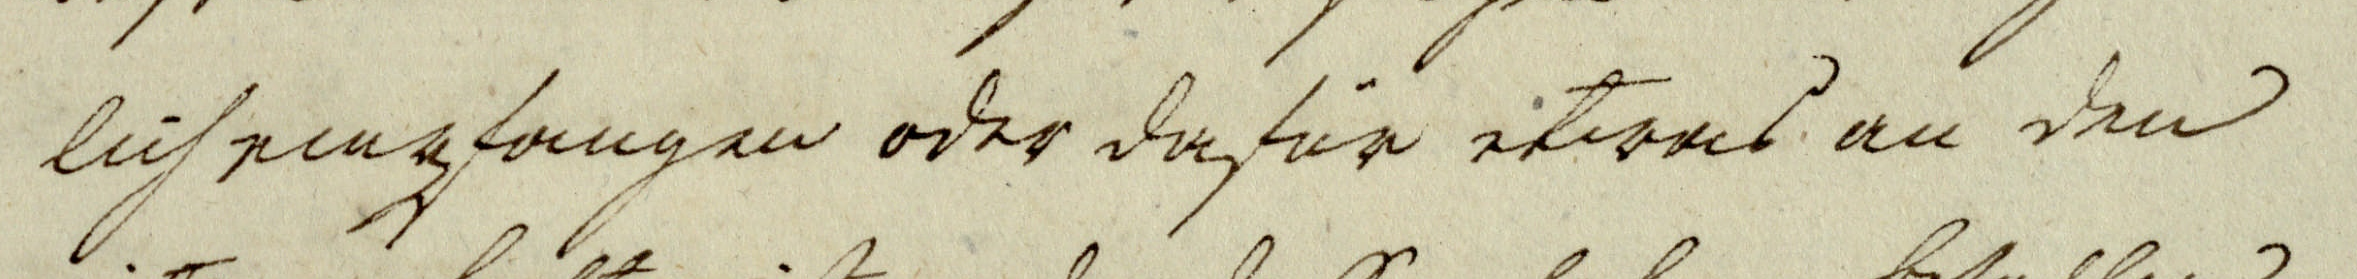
lich empfangen oder dafür etwas an den
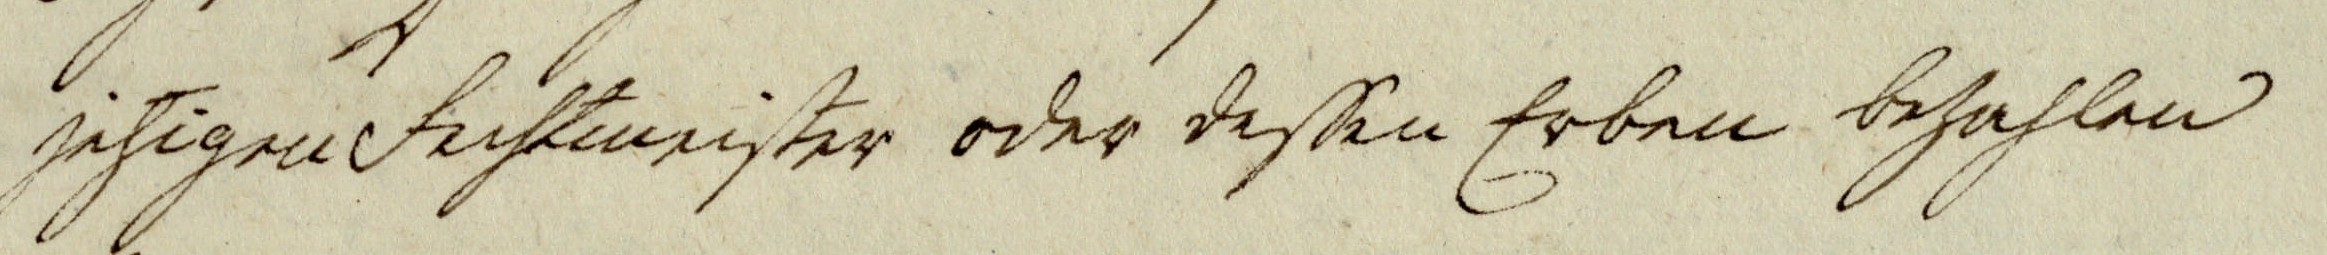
jetzigen Fechtmeister oder dessen Erben bezahlen
